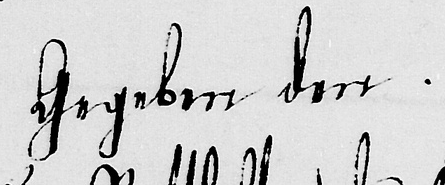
Gegeben den
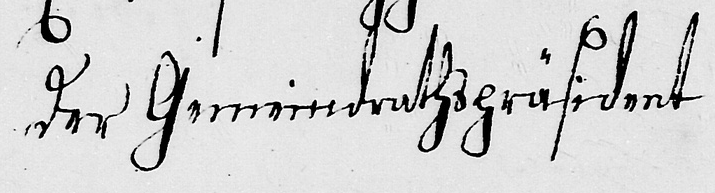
Der Gemeindrathspräsident
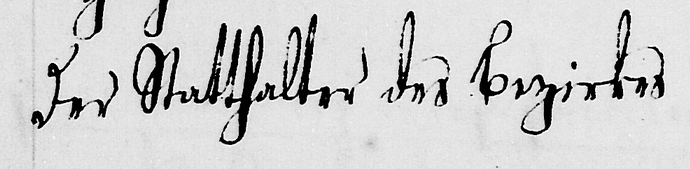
Der Statthalter des Bezirkes
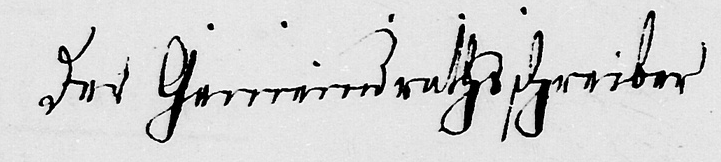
Der Gemeindrathsschreiber
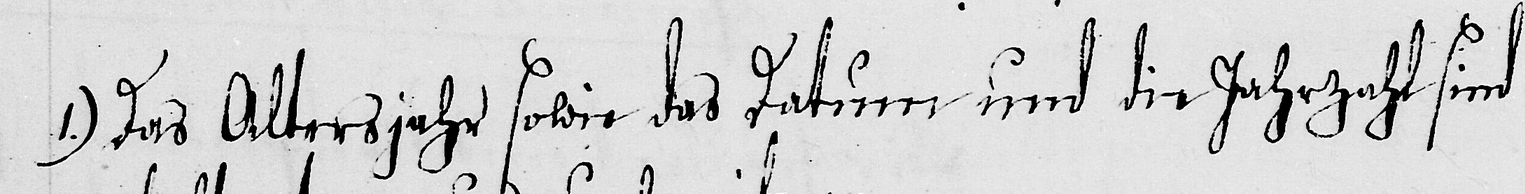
1.) Das Altersjahr sowie das Datum und die Jahreszahl s¬
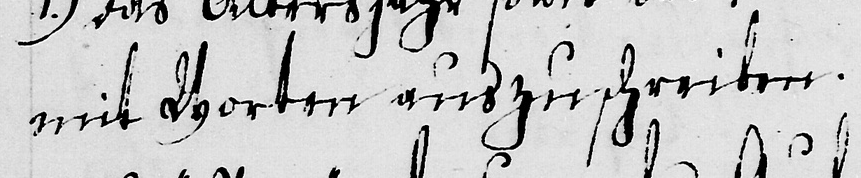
mit Worten auszuschreiben.
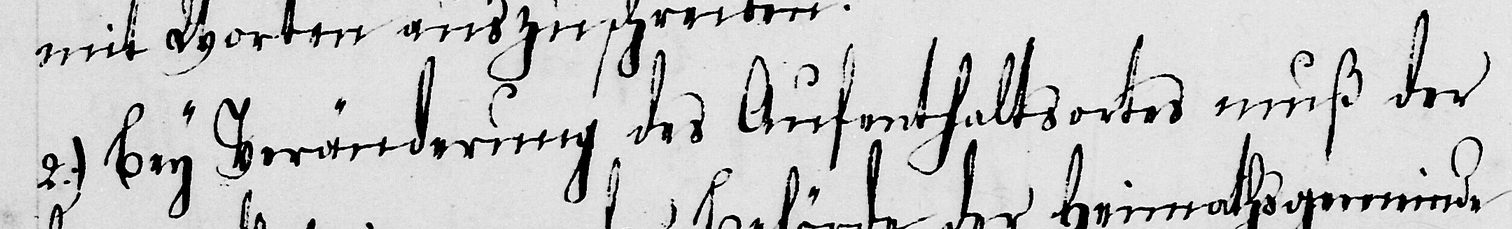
2.) Bey Veränderung des Aufenthaltsortes muß der
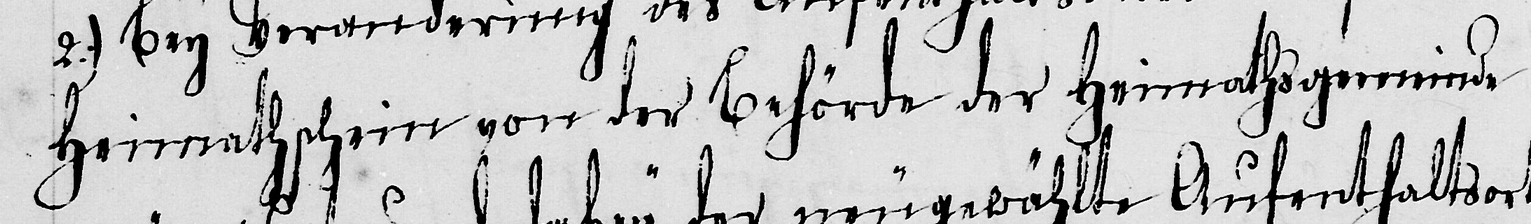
Heimathschein von der Behörde der Heimathgemeinde
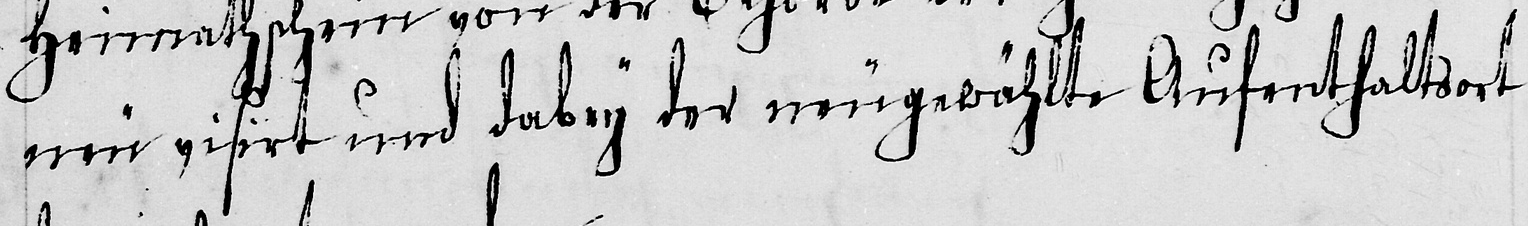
neu visirt und dabey der neugewählte Aufenthaltsort
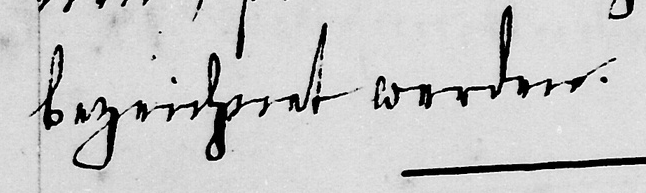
bezeichnet werden.
